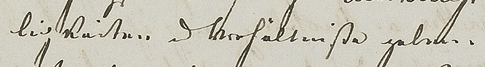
lichkeiten und Verhältniße geben.
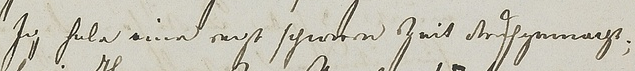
Ich habe eine recht schwere Zeit durchgemacht;
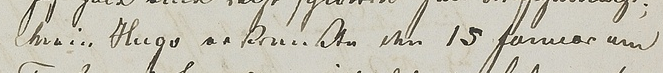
Mein Hugo erkrankte den 15 Januar am
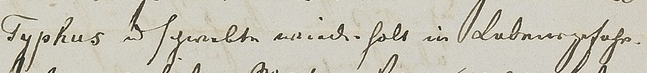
Typhus und schwebte wiederholt in Lebensgefahr.
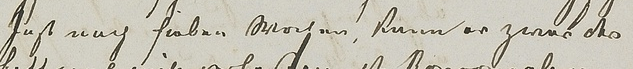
Jezt nach sieben Wochen, kann er zwar das
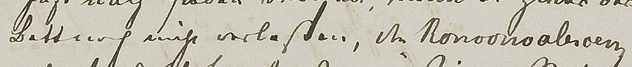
Bett noch nicht verlaßen, die Reconvalescenz
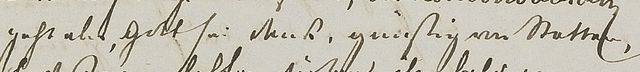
geht aber, Gott sei Dank, günstig von Statten,
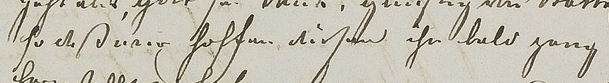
so daß wir hoffen dürfen ihn bald ganz
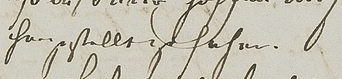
hergestellt zu sehen.
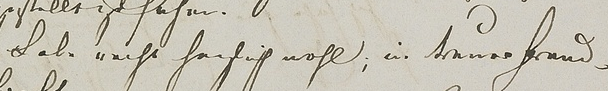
Lebe recht herzlich wohl; in treuer Freund-
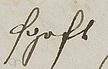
schaft
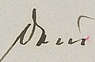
Dein
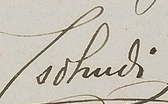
Tschudi
